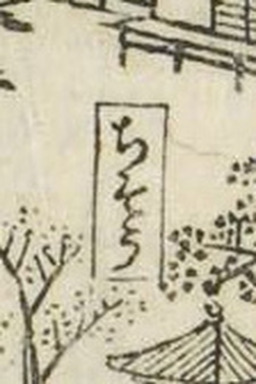ちそう
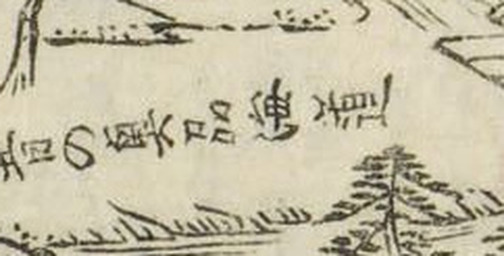昔の奥州海道
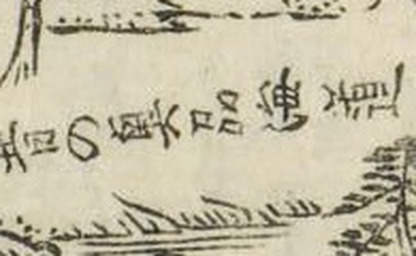昔の奥州海道
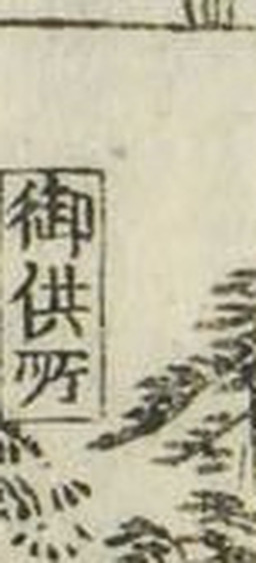御供所

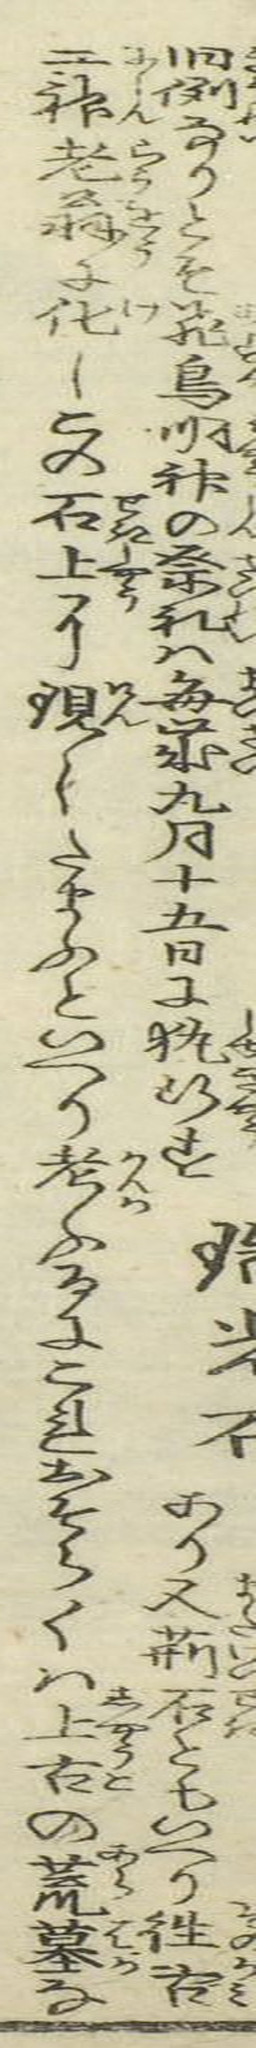二神老翁に化しこの石上に現したまふといへり考ふるにこれおそらくは上古の荒墓ならんか
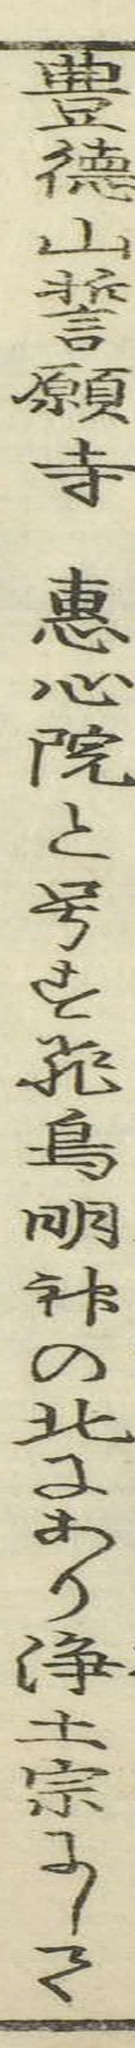豊徳山誓願寺恵心院と号す飛鳥明神の北にあり浄土宗にして
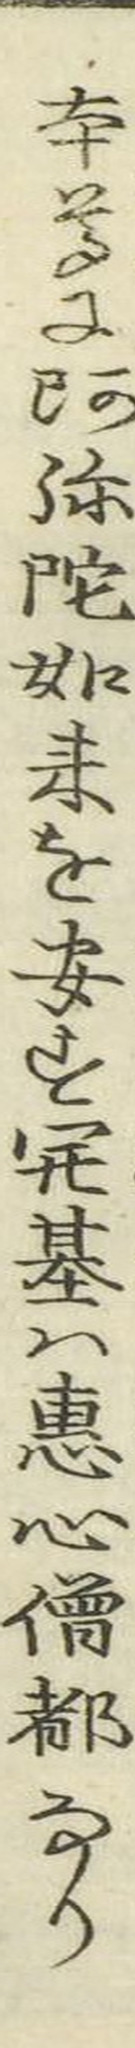本尊に阿弥陀如来を安す開基は恵心僧都なり
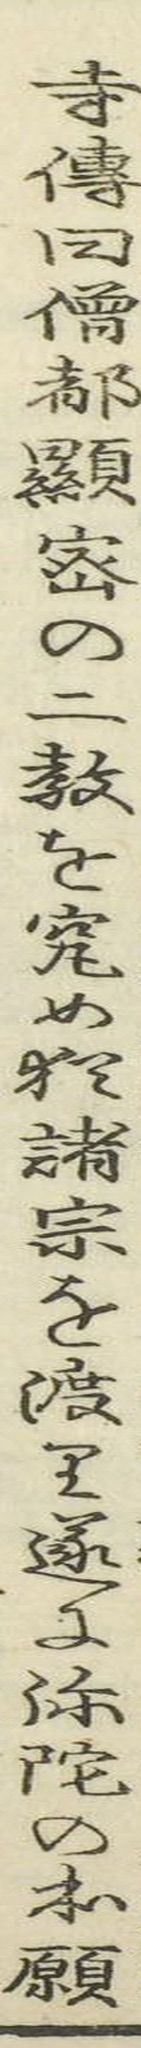寺伝曰僧都顕密の二教を究め猶諸宗を渡り遂に弥陀の本願
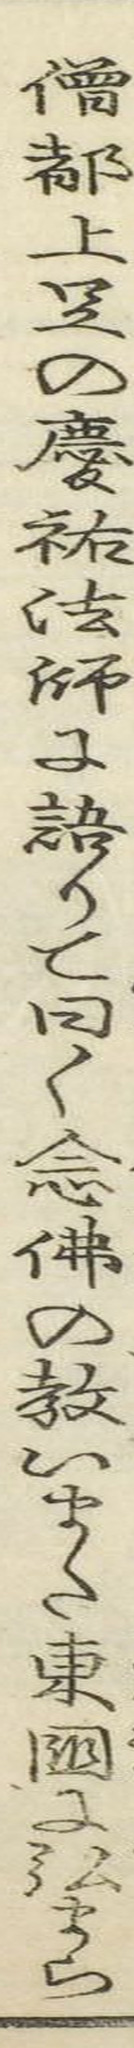僧都上足の慶祐法師に語りて曰く念仏の教いまた東国に弘まら
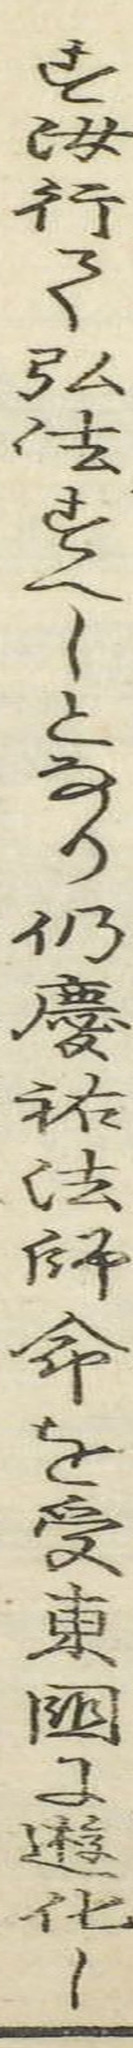す汝行て弘法すへしとなり仍慶祐法師命を受東国に遊化し
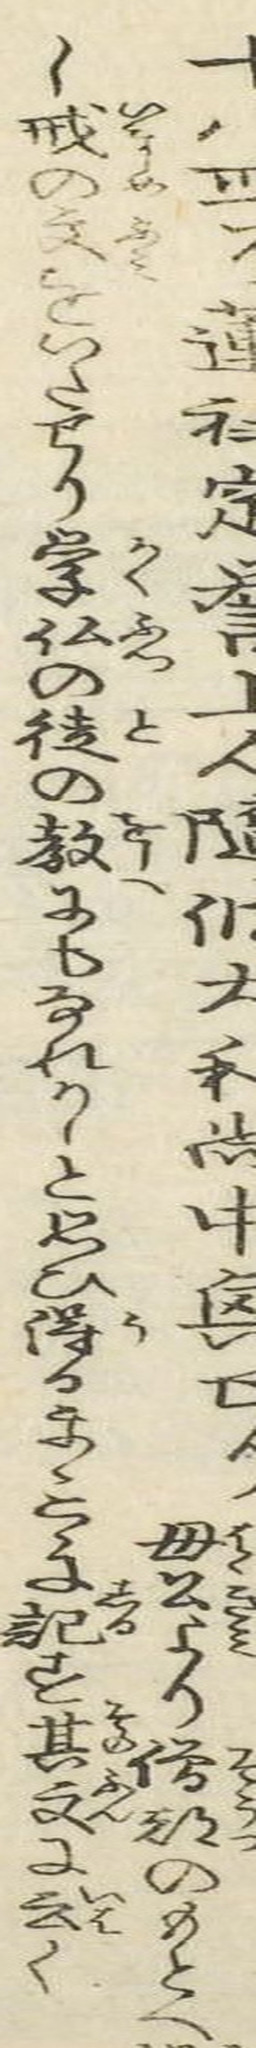し戒の文をいたせり学仏の徒の教にもなれかしと思ひ得るまゝこヽに記す其文に云く
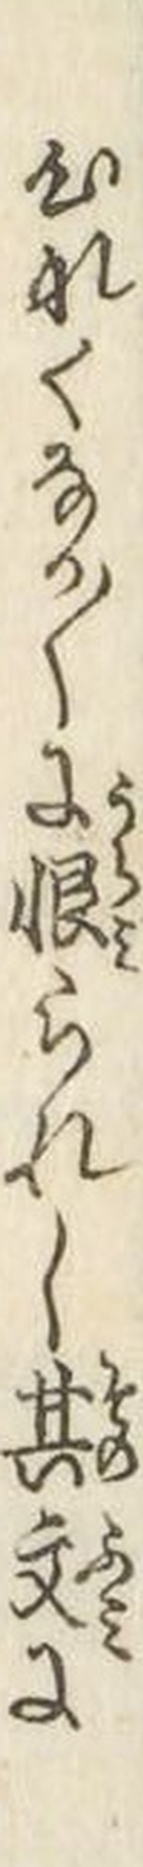心なくなか〳〵に恨られし其文に

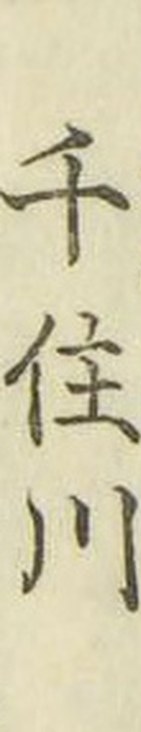千住川
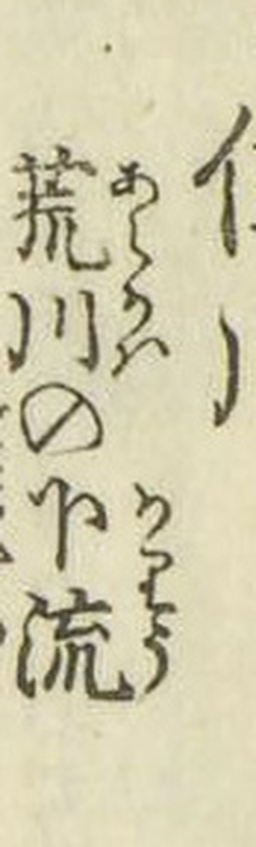荒川の下流
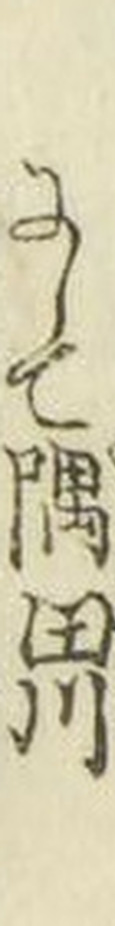にて隅田川
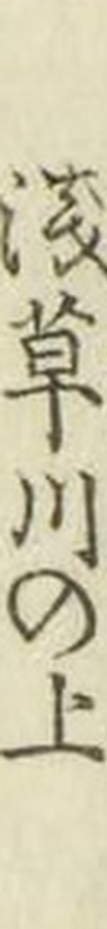浅草川の上
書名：江戸名所図会 20巻 巻之17
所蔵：東京学芸大学教育コンテンツアーカイブ
